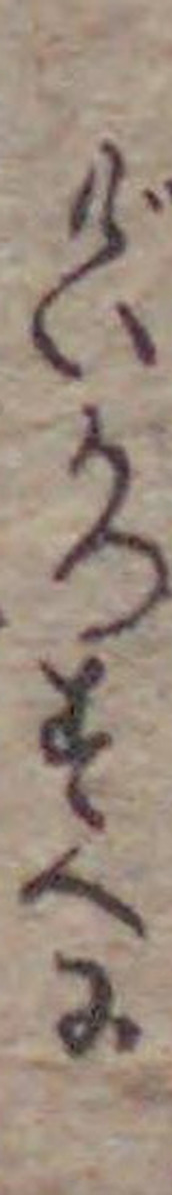げいかつすへに
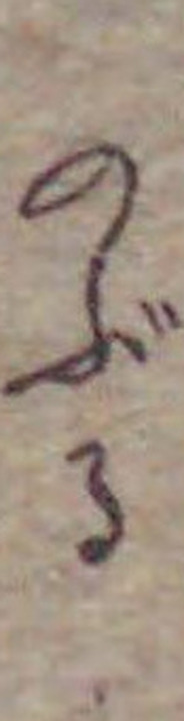のぶる
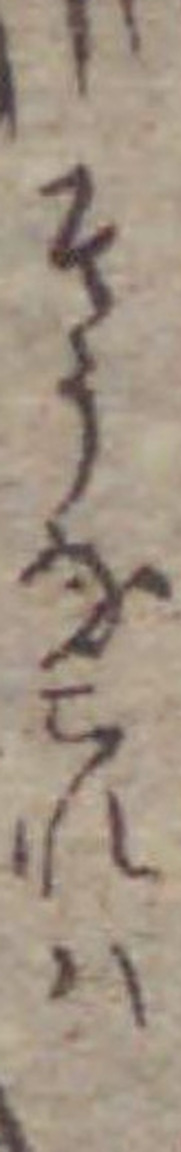そうなこれは
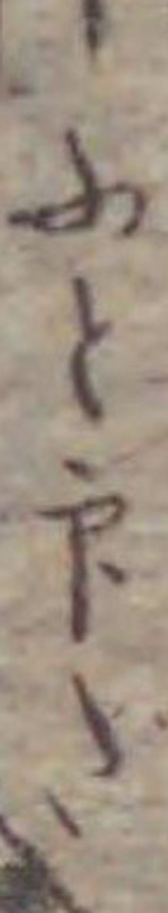ふと印だ
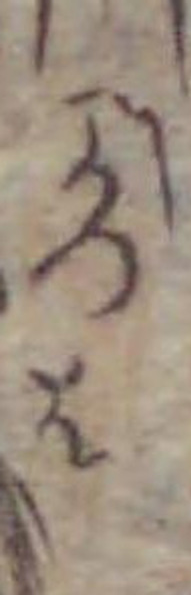〽かつは
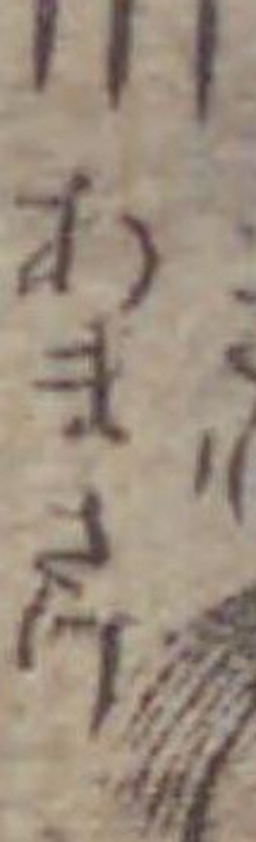あまさけ
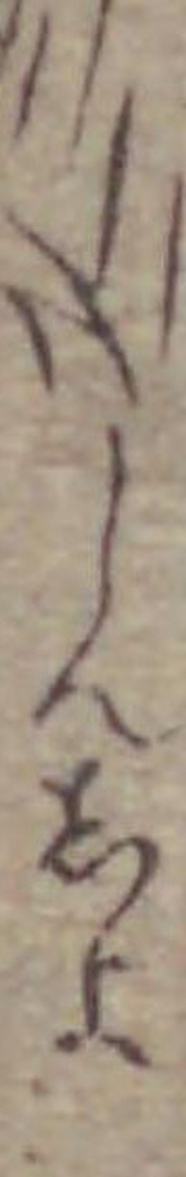しんしょ
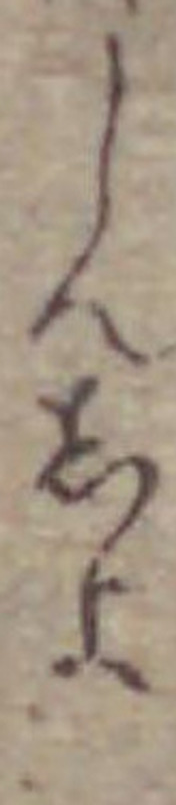しんしょ
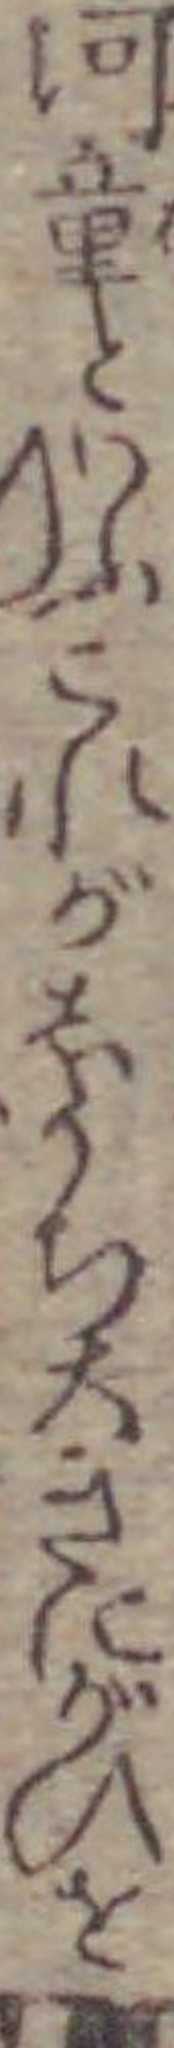河童といふこれがしうち大きにがひ
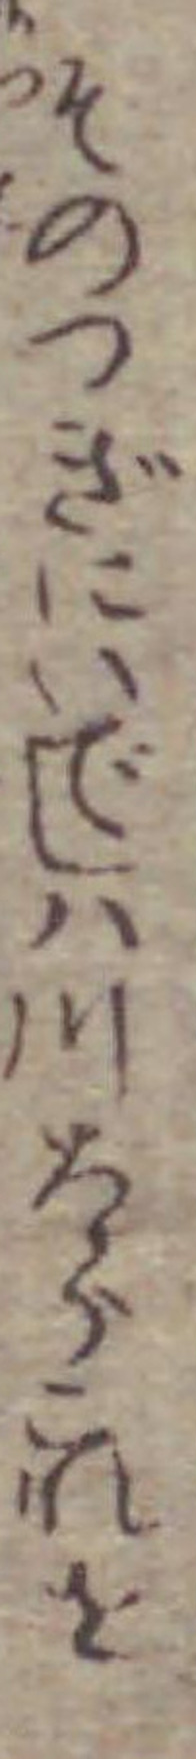そのつぎにいでしは川太郎これを
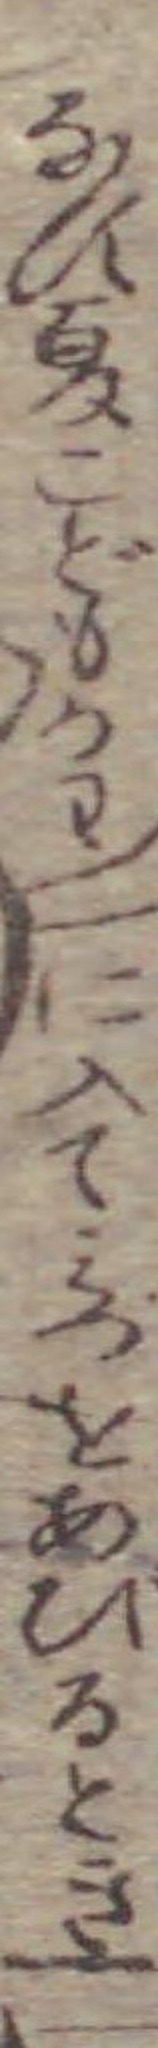をなす夏こどもかわに入りてみずをあびるとき
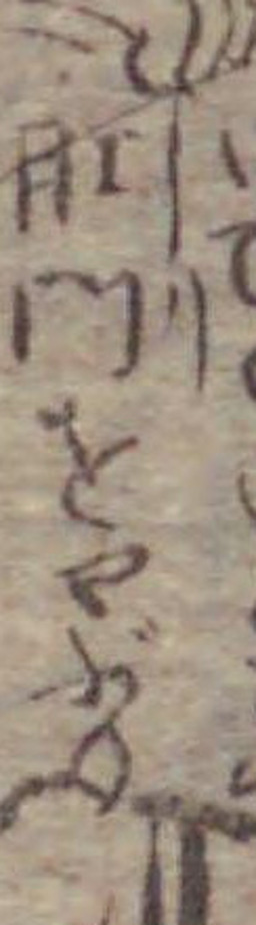肛門をやぶり
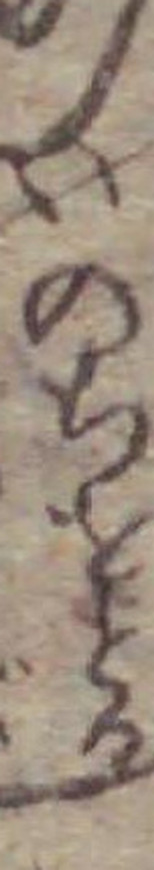いのちをとる
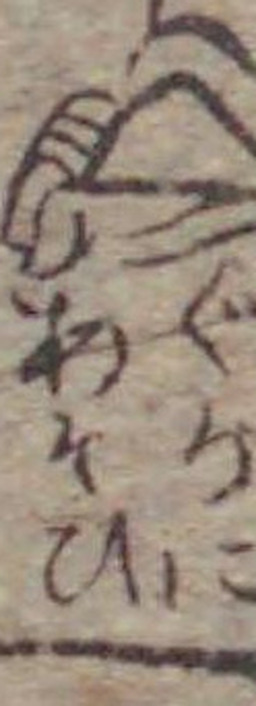あそひ
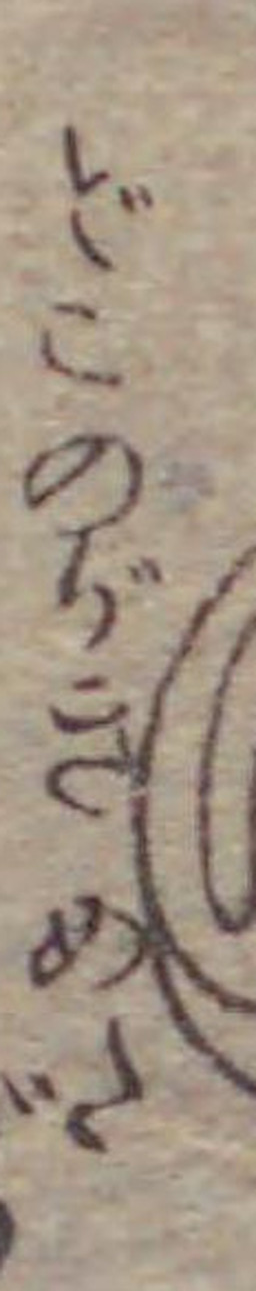どこのがきめた
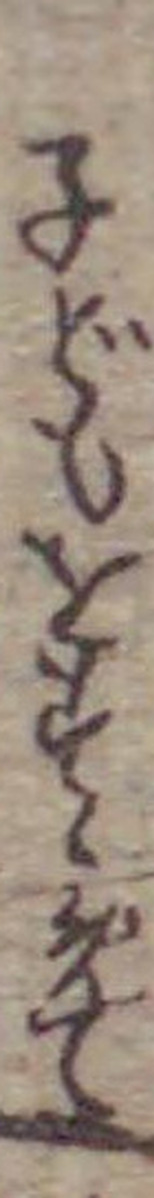こどもをすゝめて
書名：妖怪仕内評判記 : 2巻
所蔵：国立国会図書館 National Diet Library, JAPAN
